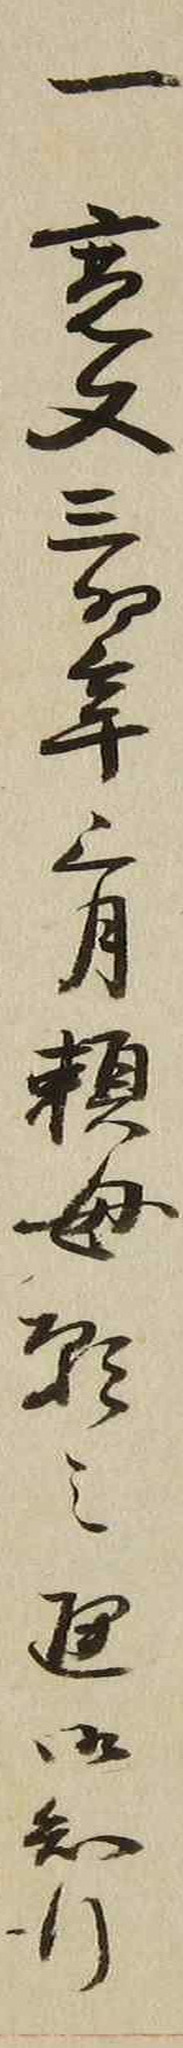一寛文三卯年三月賴母願之通御知行
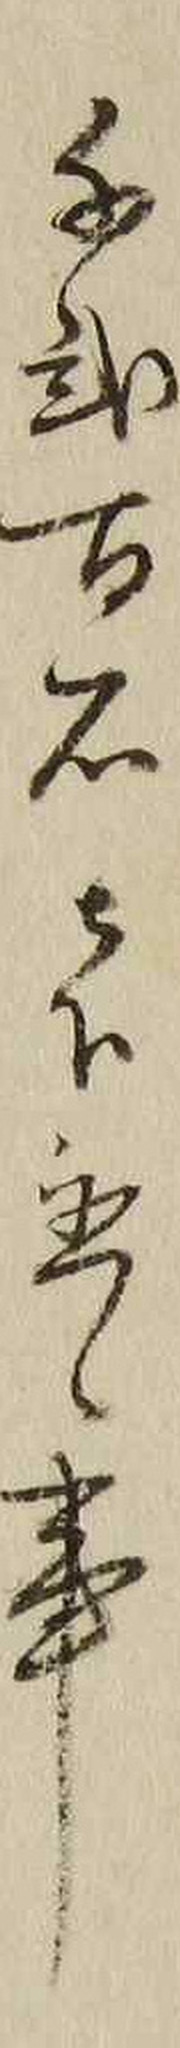千弐百石被下置候事
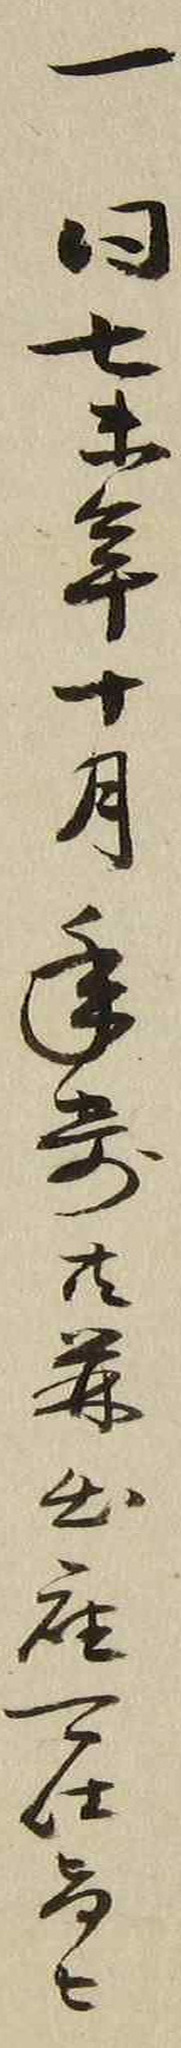一同七未年十月年寄共并出座可仕旨被
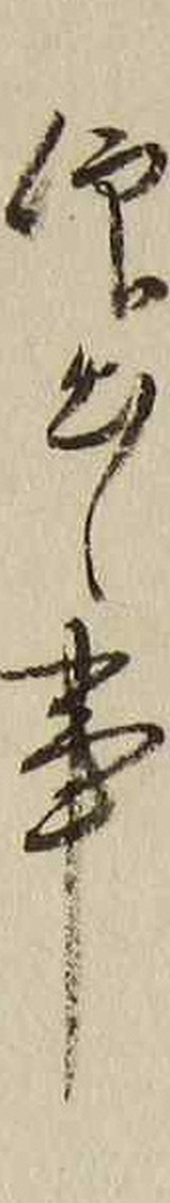仰出候事
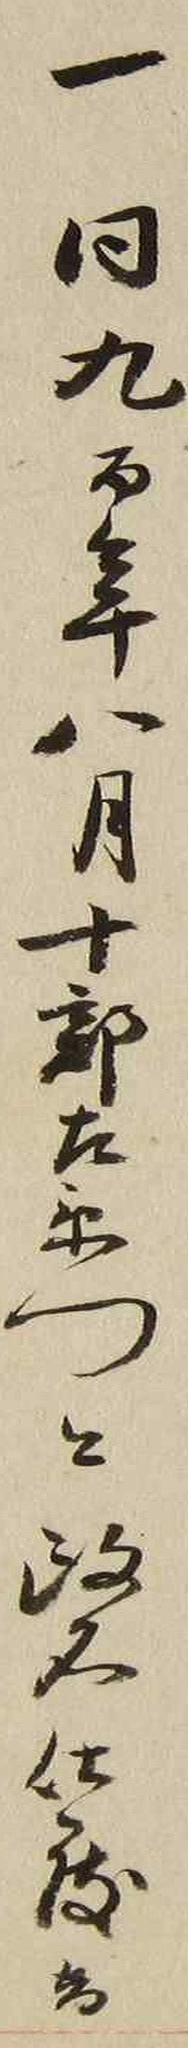一同九酉年八月十郎左衛門と改名仕度旨
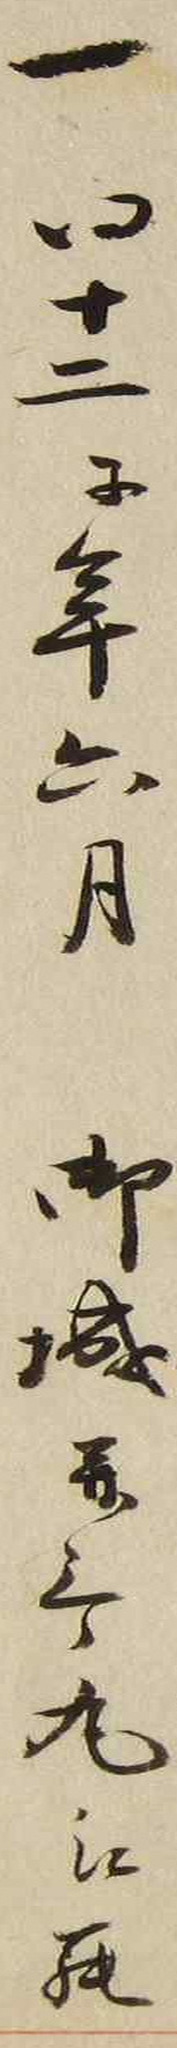一同十二子年六月御城并三之丸江罷

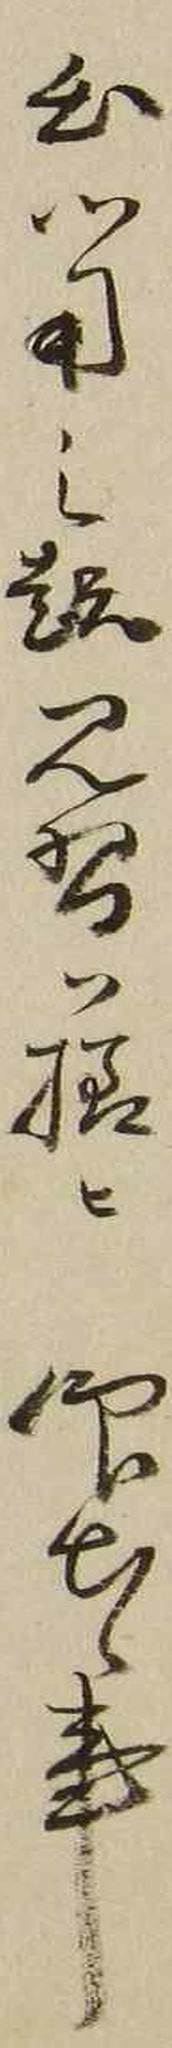出御用之趣見習候様被仰付候事
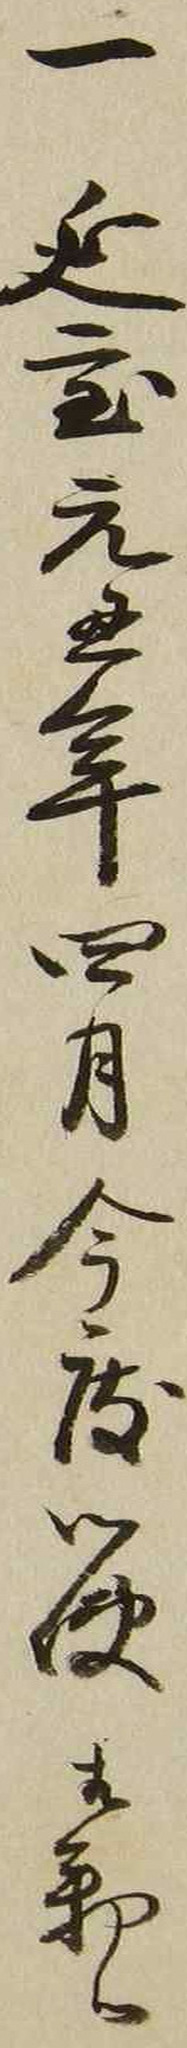一延宝元丑年四月今度御使相勤候
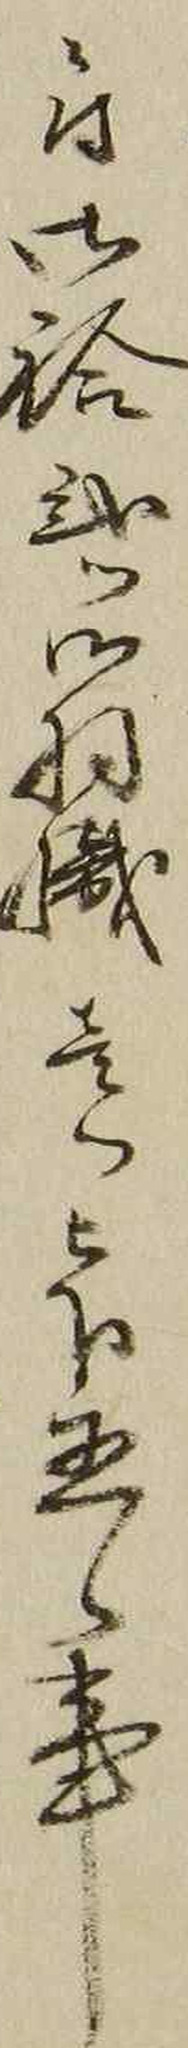に付御袷弐つ御羽織壱つ被下置候事
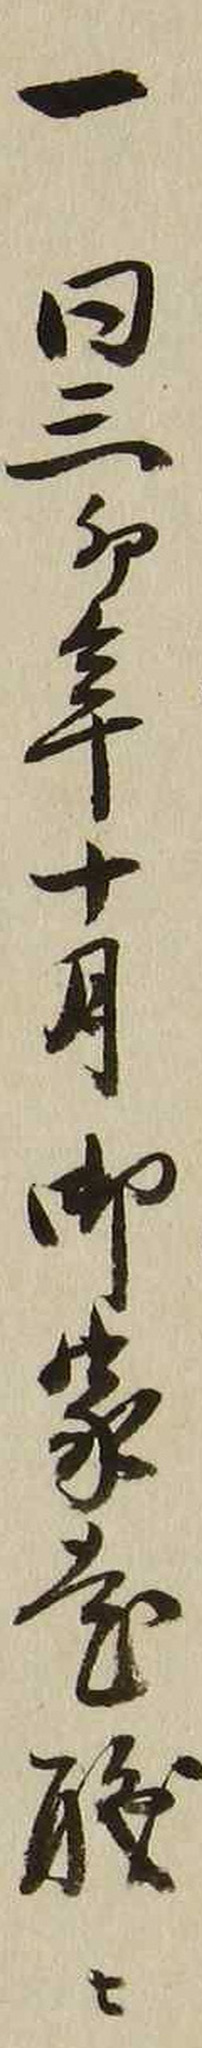一同三卯年十月御家老職被
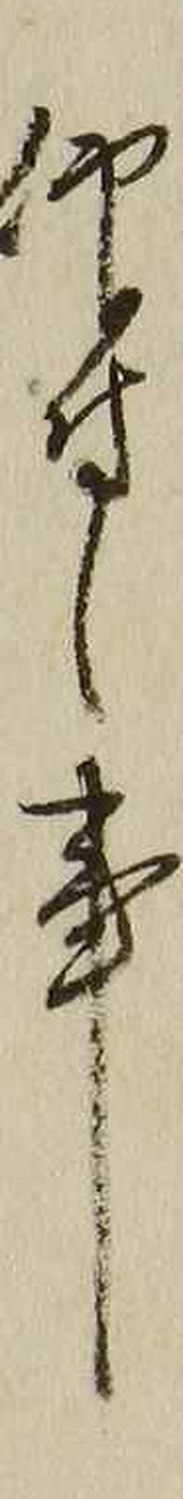仰付候事
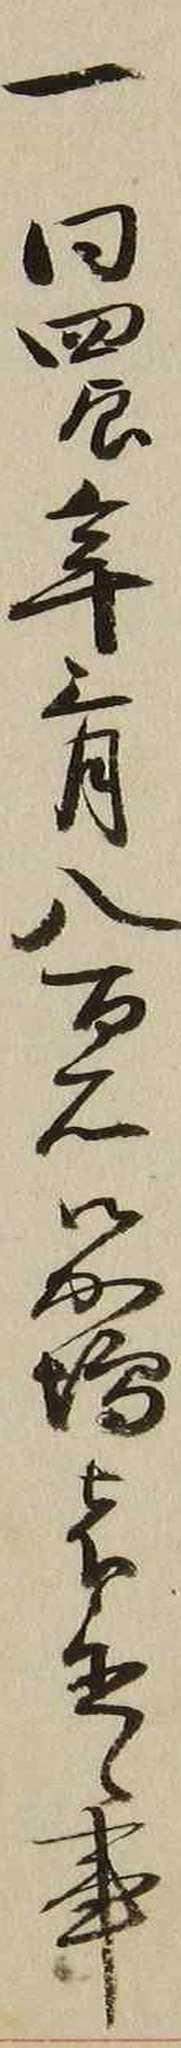一同四辰年三月八百石御加増被下置候事
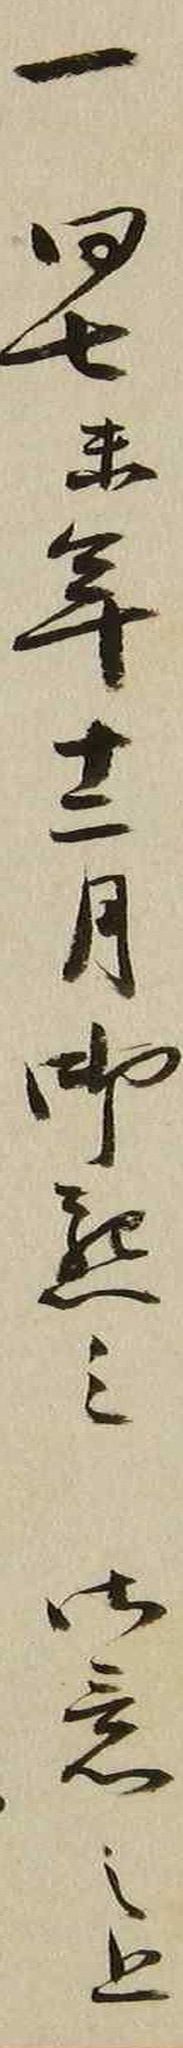一同七未年十二月御懇之御意之上
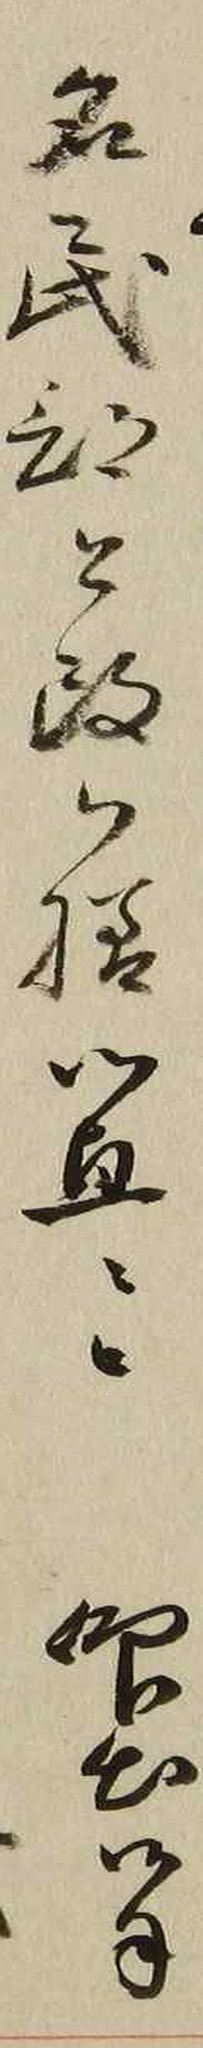名民部と改候様御懇に被仰出御手
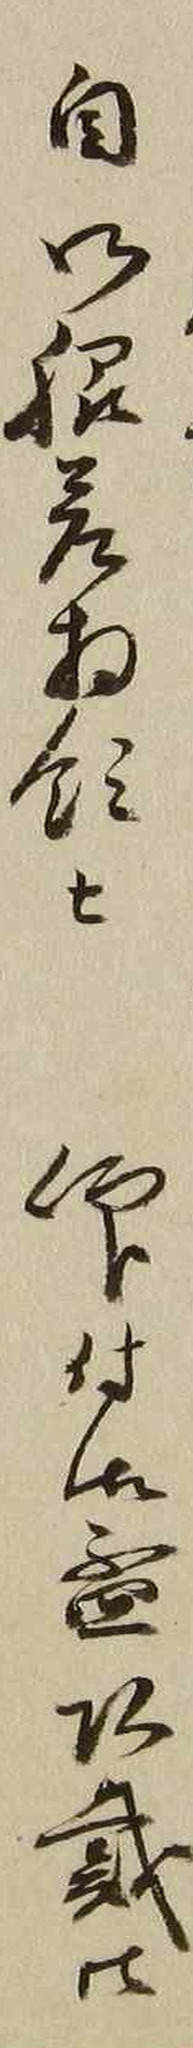自御脇差拝領被仰付御盃頂戴仕
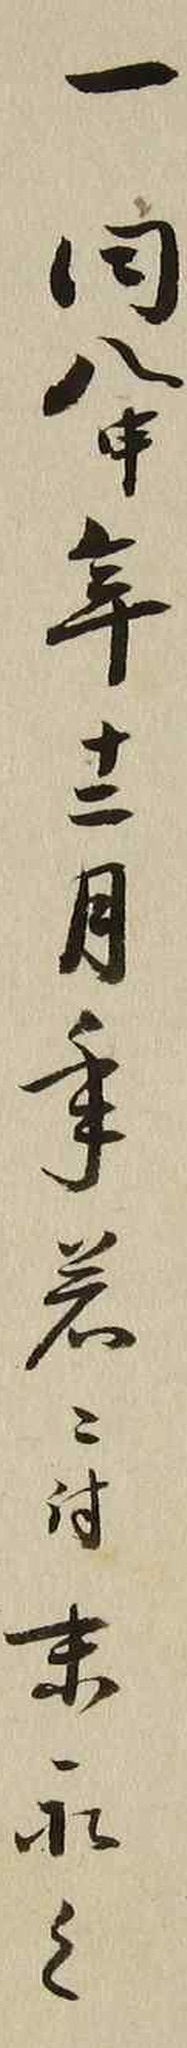一同八申年十二月年若に付末永く
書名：諸士系譜　巻之269　さ之部1
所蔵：会津若松市立会津図書館
